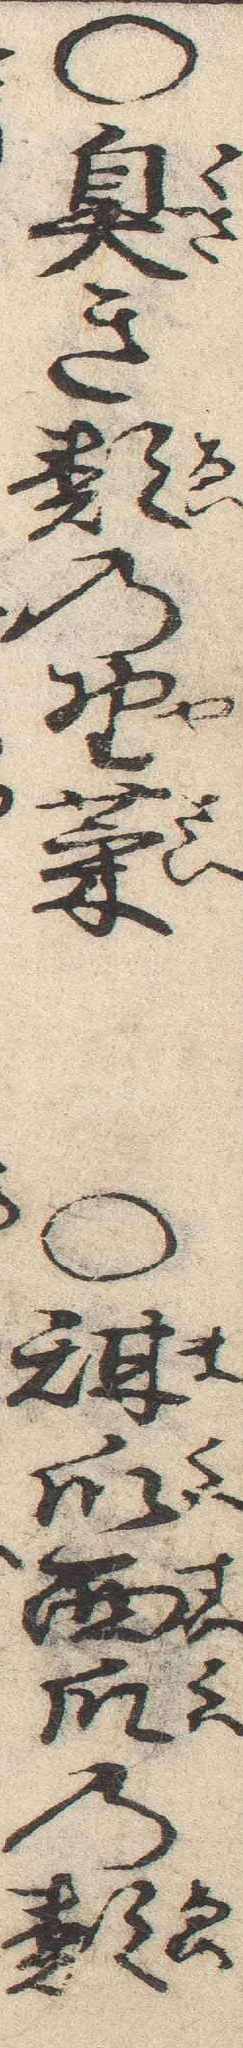○臭き類の野菜○甜瓜西瓜の類
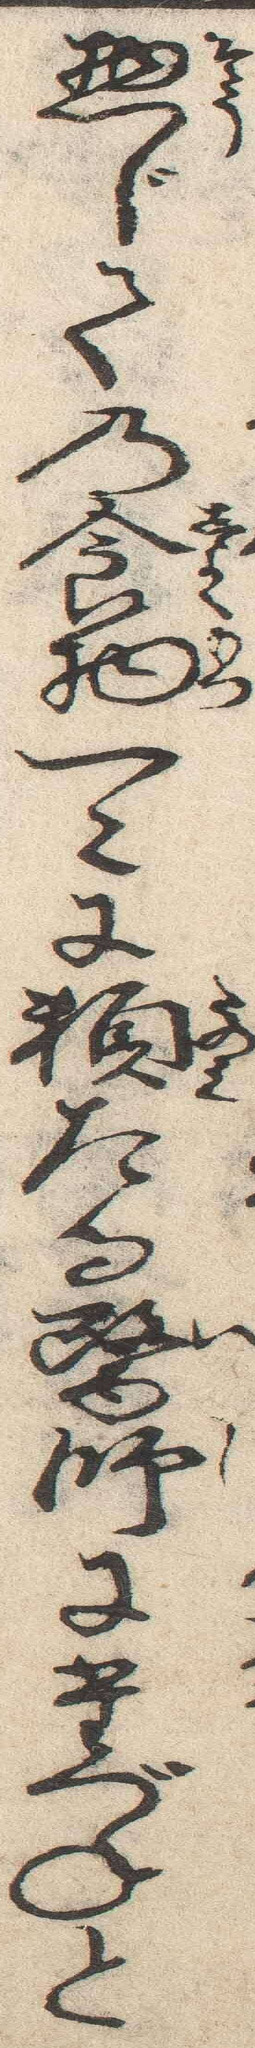総じての食物一々に頼たる医師にたづねと
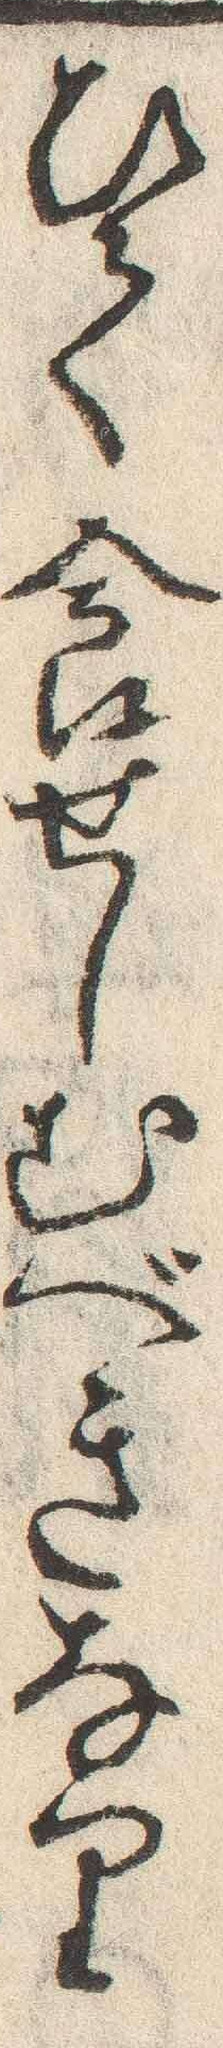ひて食せしむべきなり
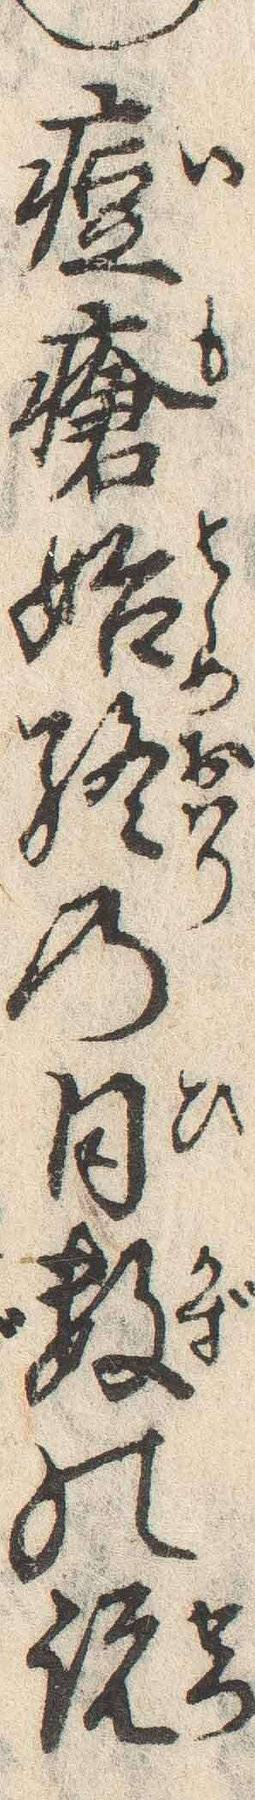㊆痘瘡始終の日数の説
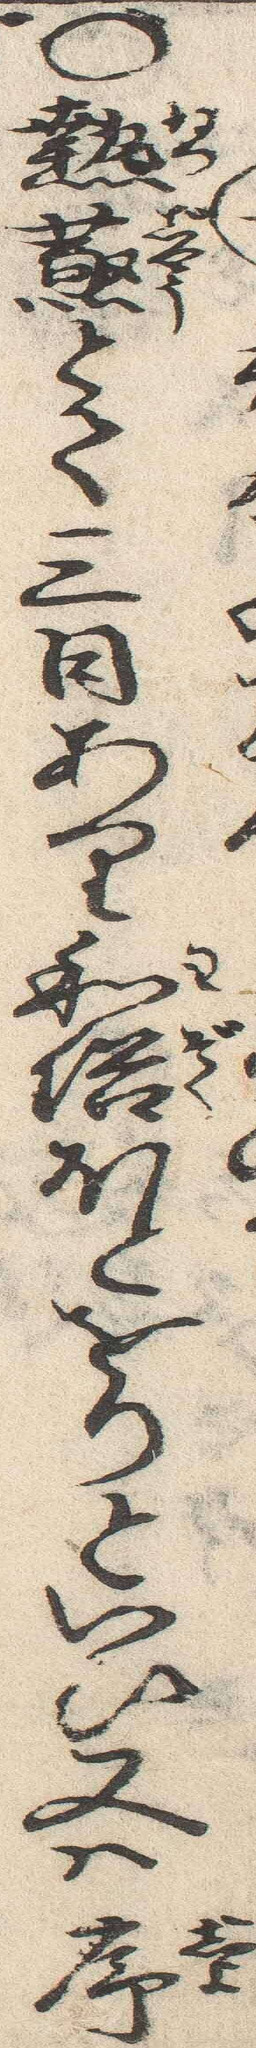○熱蒸とて三日あり和俗ほとをりといひ又は序
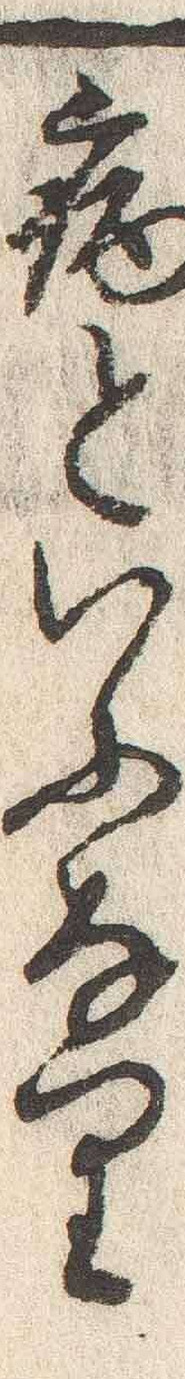病といふなり
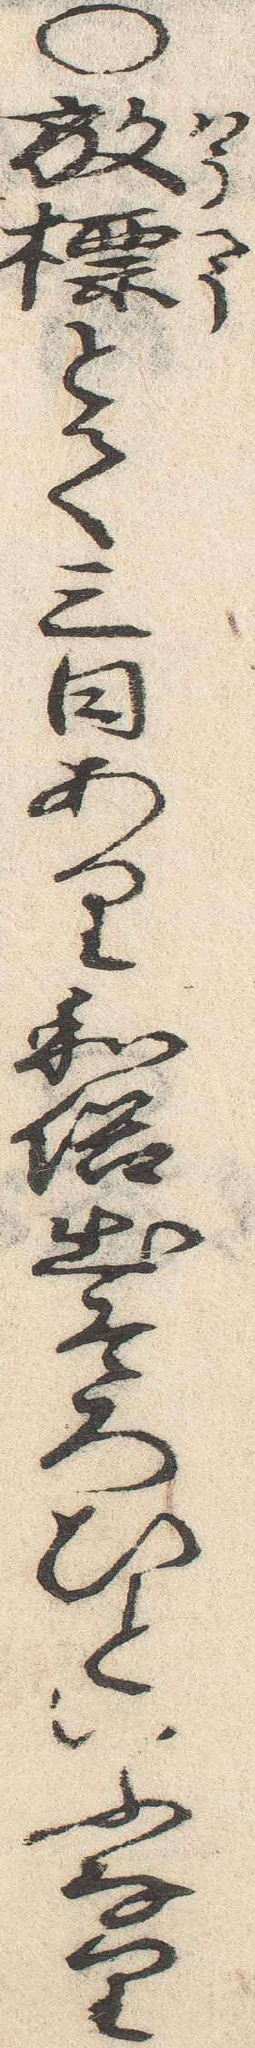○放標とて三日あり和俗出そろひといふなり
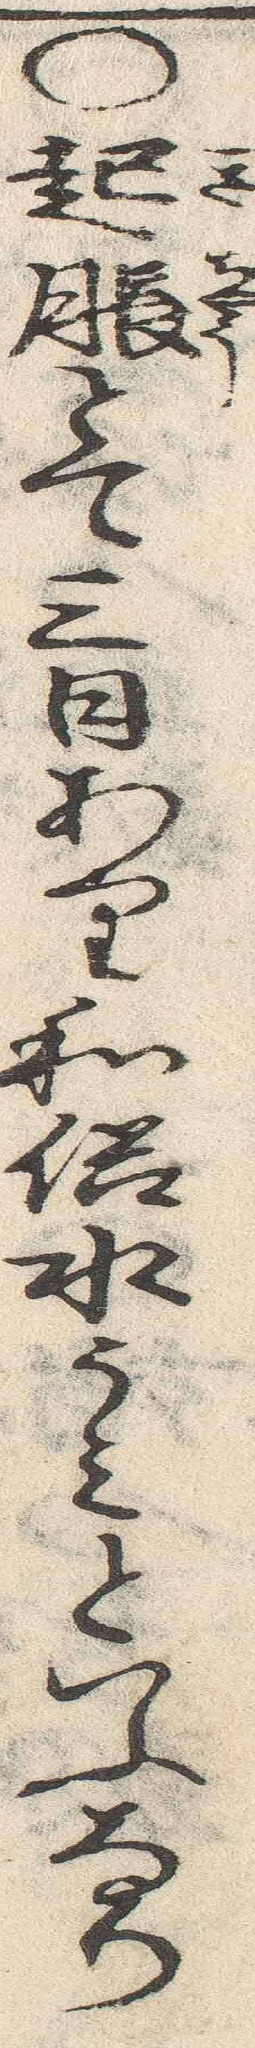○起脹とて三日あり和俗水うみといふなり
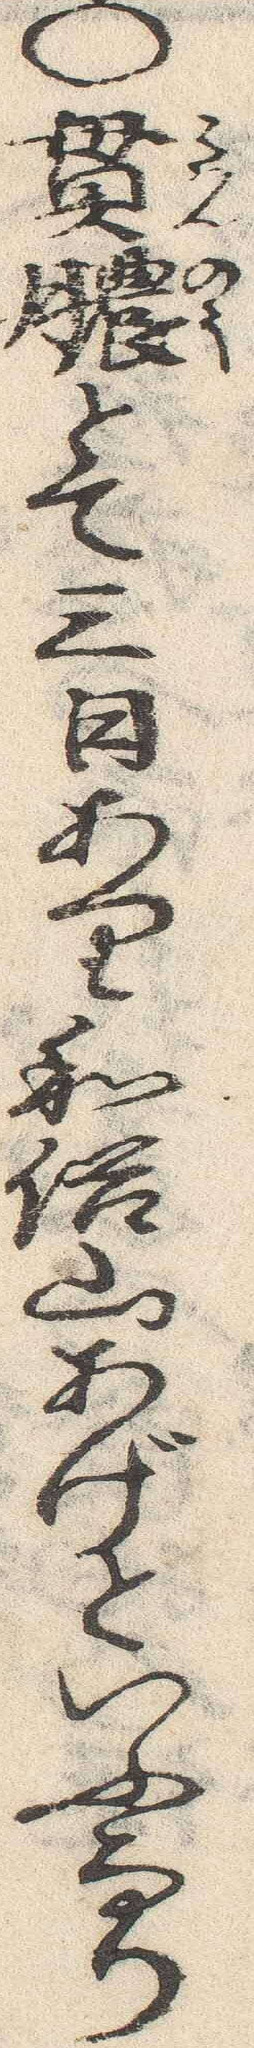○貫膿とて三日あり和俗山あげといふなり
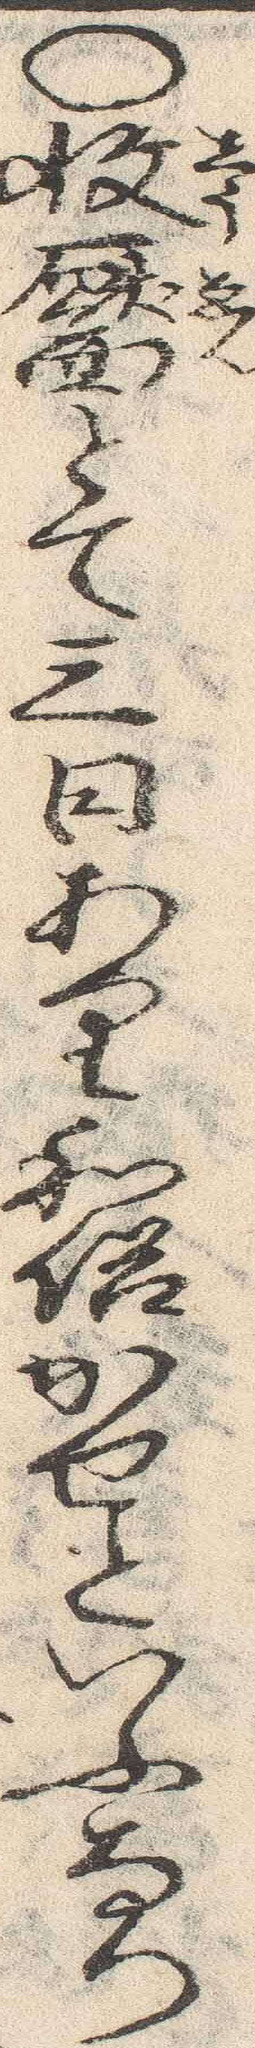○収靨とて三日あり和俗かせといふなり
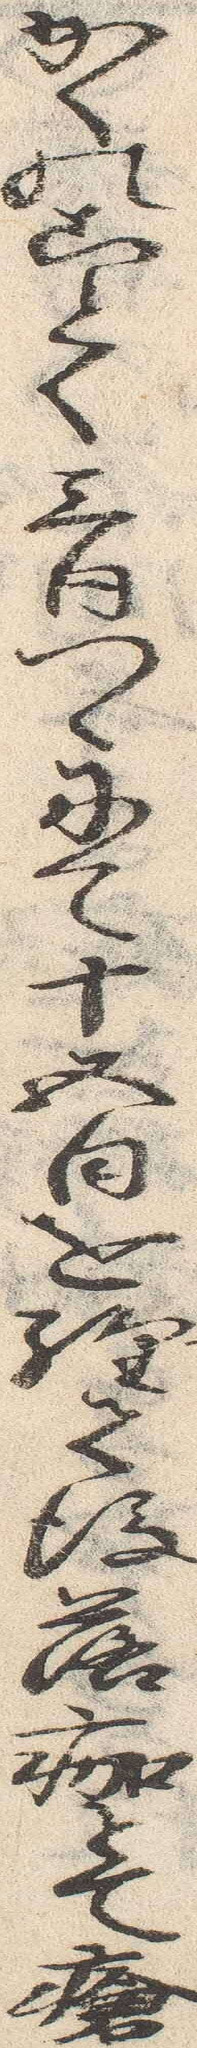かくのことく三日つゝにて十五日を経て後落痂とて瘡
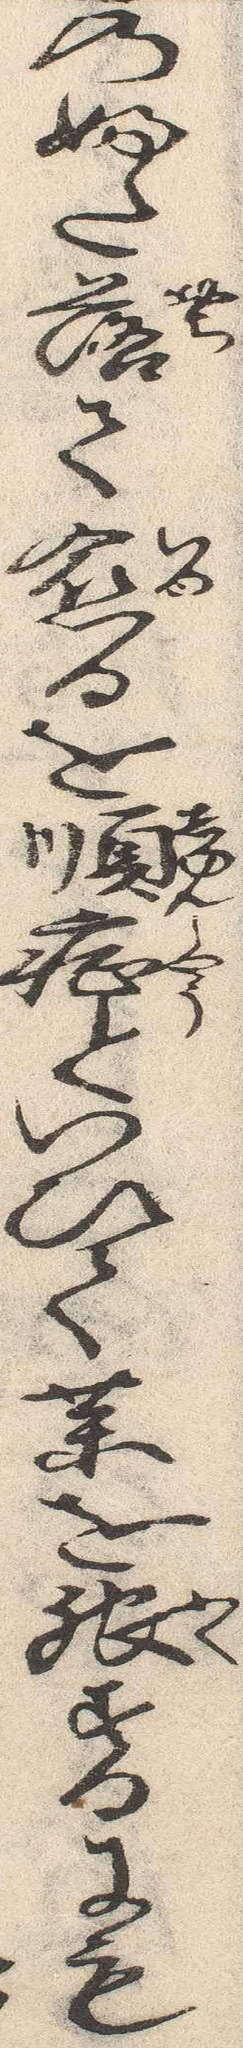のふた落て愈るを順症といひて薬を服するにも
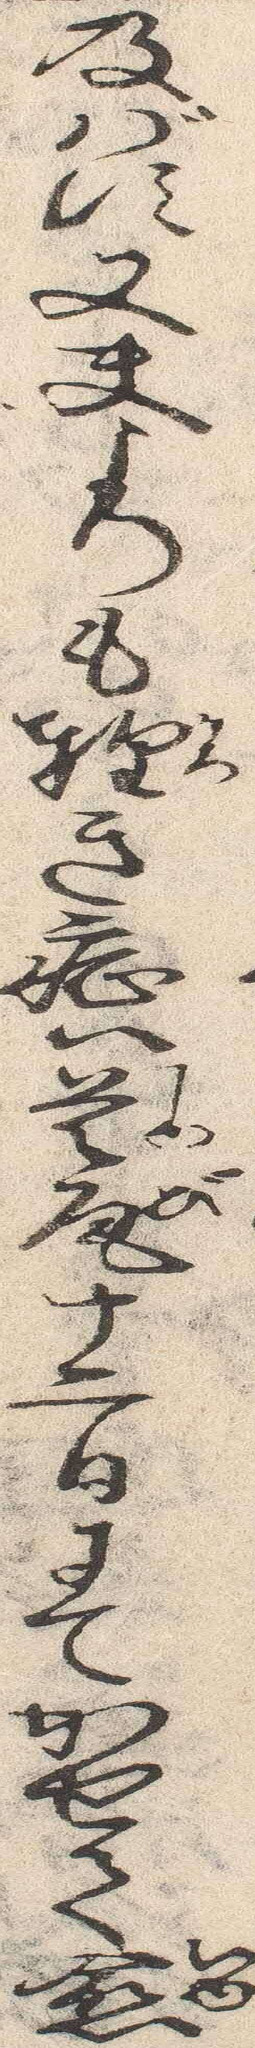及ばす又夫よりも軽き症は首尾十二日にてかせて愈
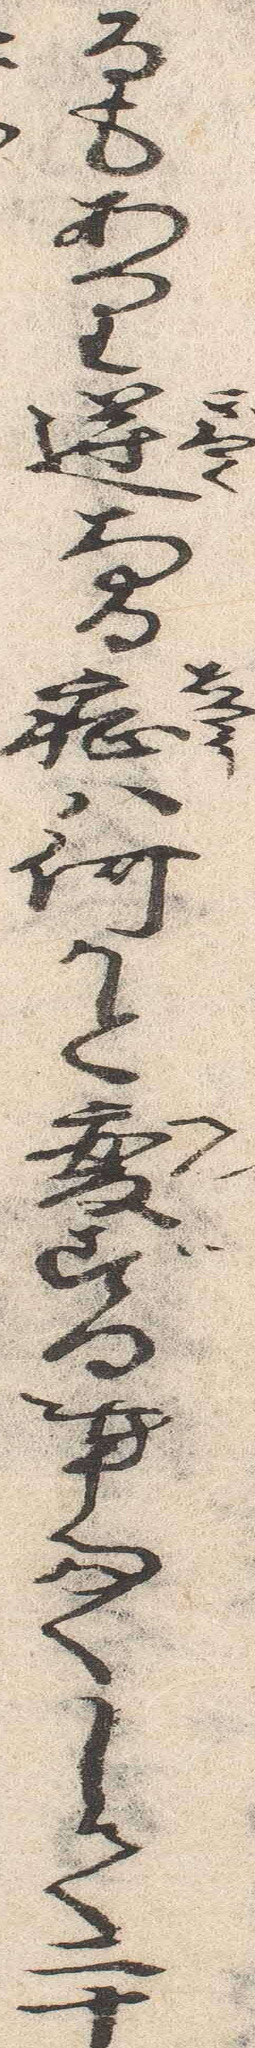るもあり逆なる症は何かと変ずる事多くして二十
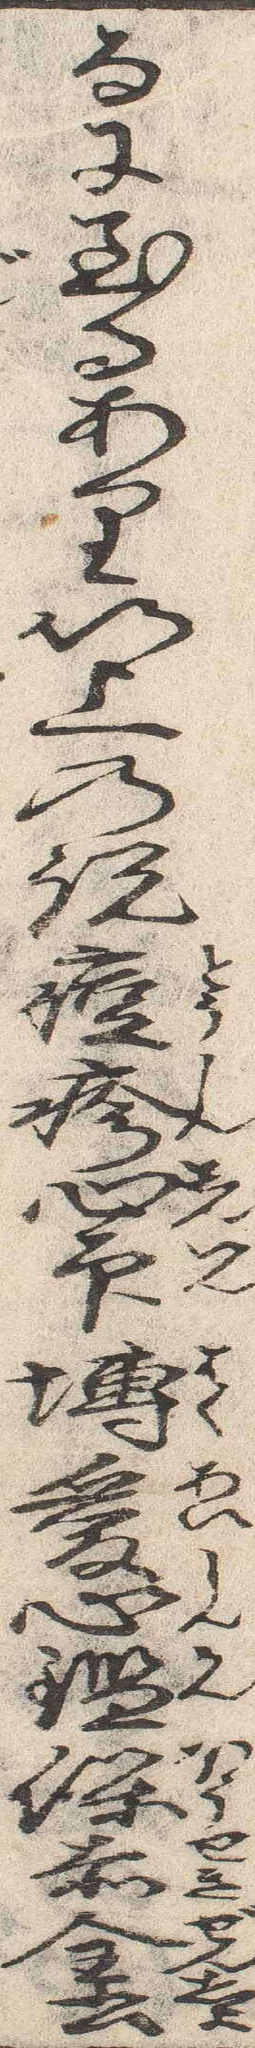るに至るあり以上の説痘疹心印博愛心鑑保赤全書
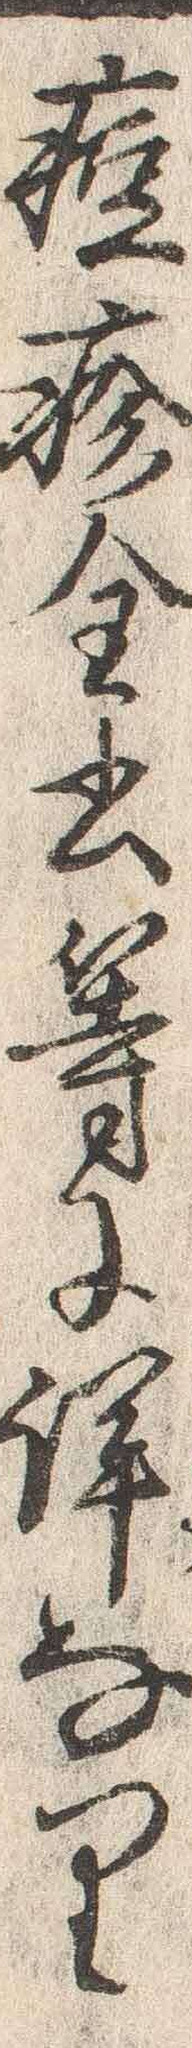痘疹全書等に詳なり
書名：小児必用養育草
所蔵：東京学芸大学附属図書館 国文学研究資料館
